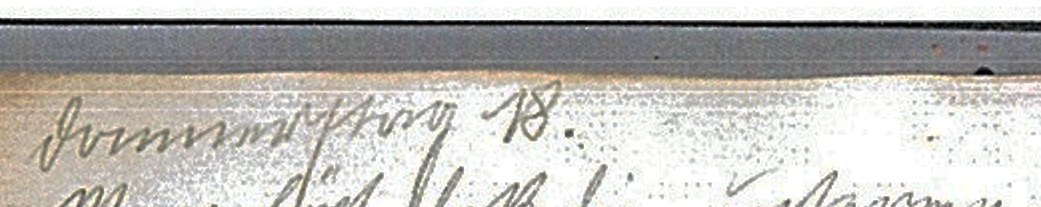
Donnerstag 18.
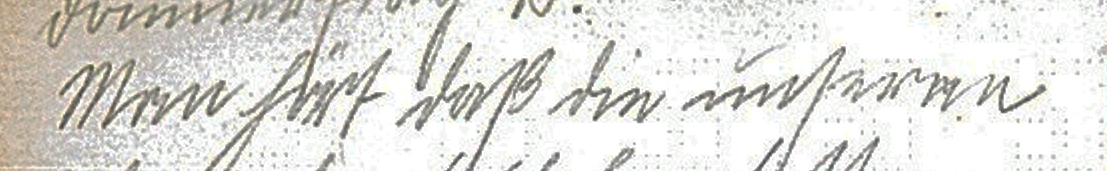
Man hört daß die unseren
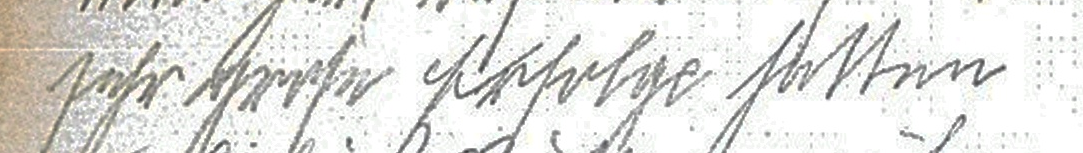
sehr große Erfolge hatten
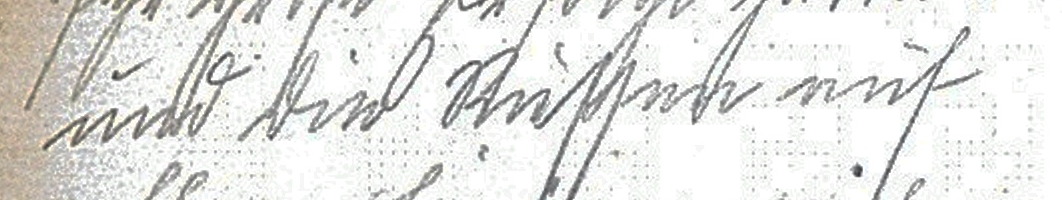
und die Russen auf
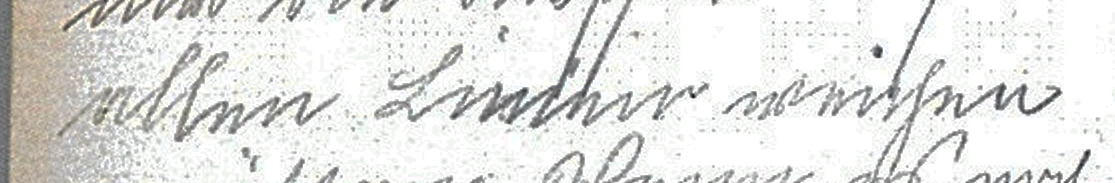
allen Bxxx weichen
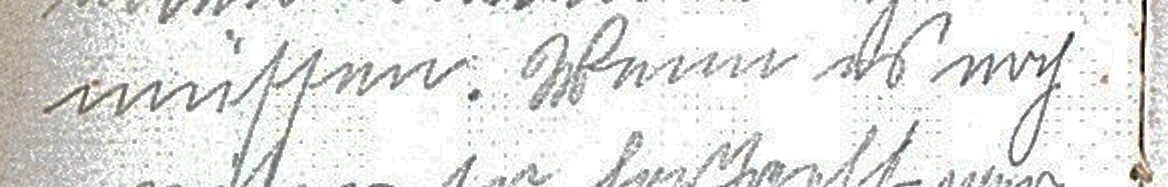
müssen. Wenn es noch
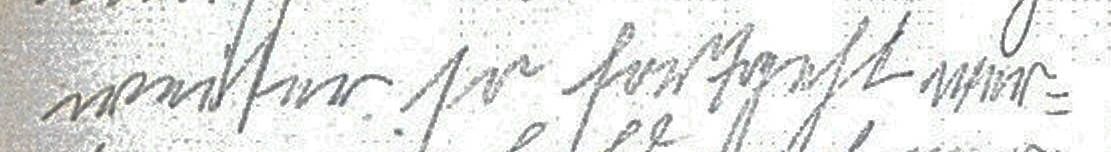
weiter so fortgeht wer-
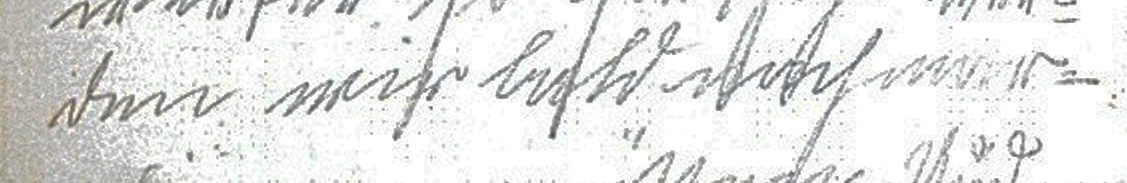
den wir bald nach mar-
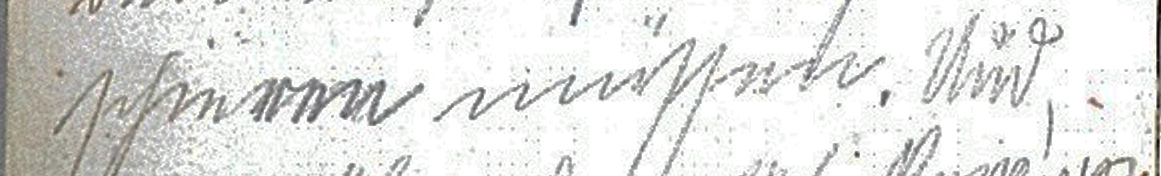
schieren müssen. Und
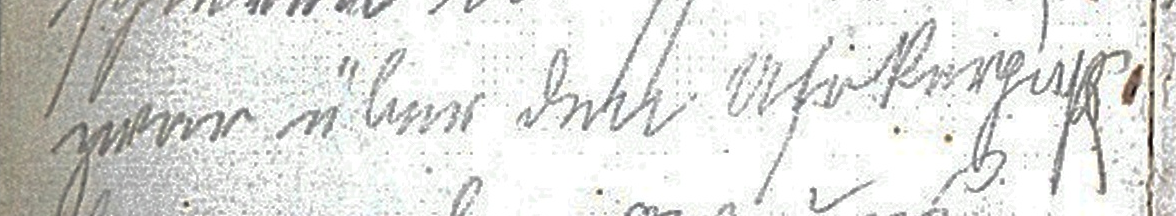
zwar über den Asokxx
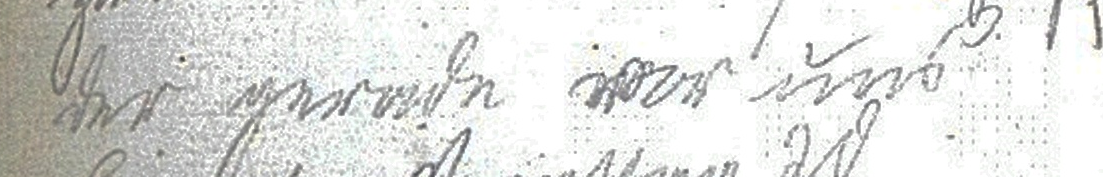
der gerade vor uns
